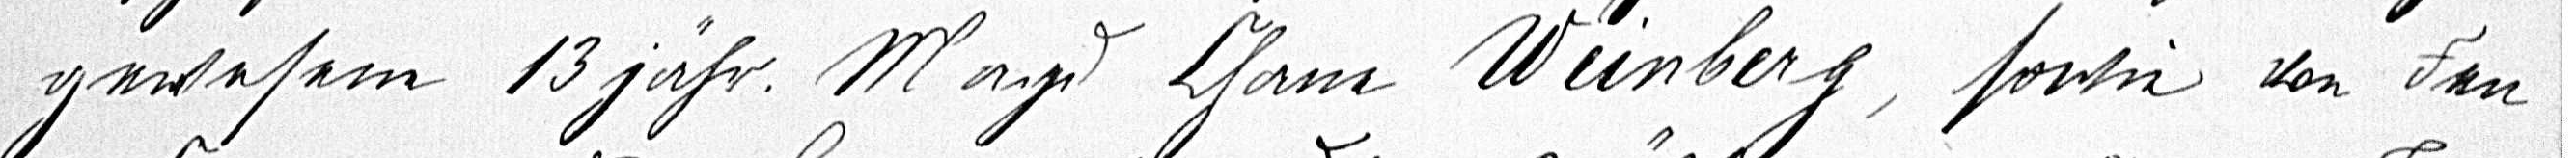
gewesem 13 jähr. Magd Cham Weinberg, sowie von den
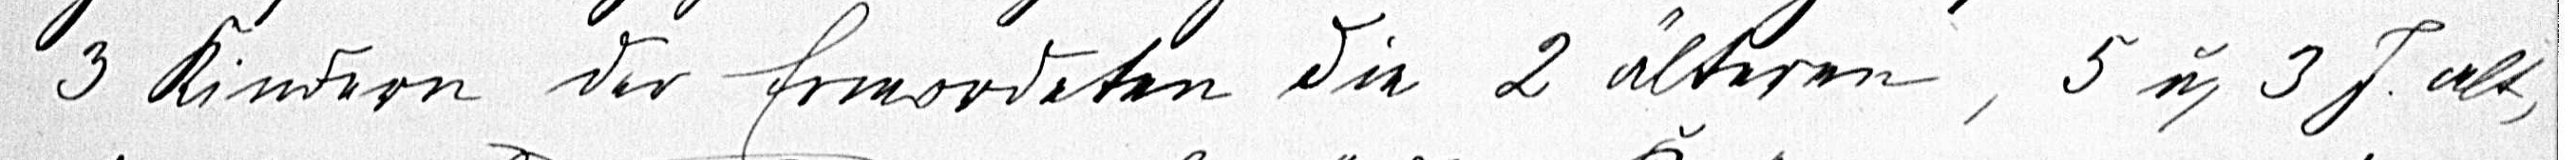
3 Kinder der Ermordeten die 2 älteren, 5 u/ 3 J. alt,
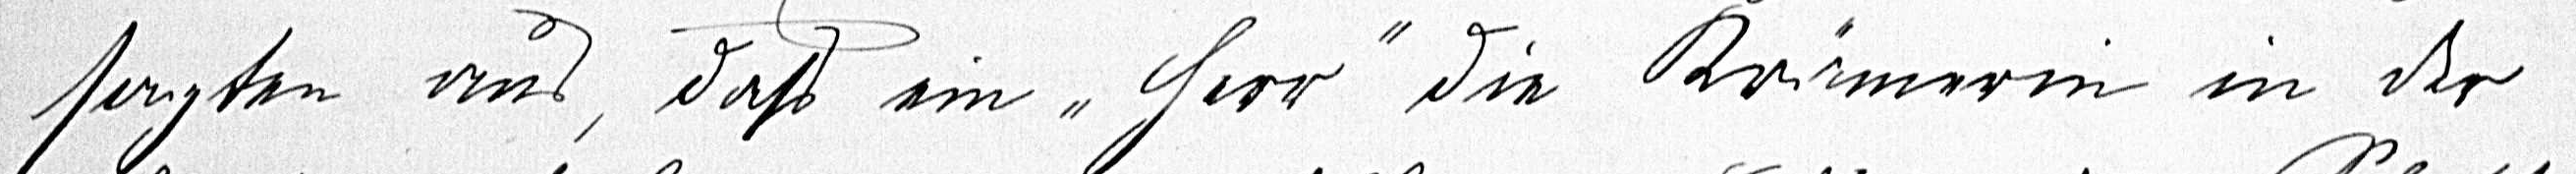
sagten aus, daß ein „Herr" die Krämerin in der
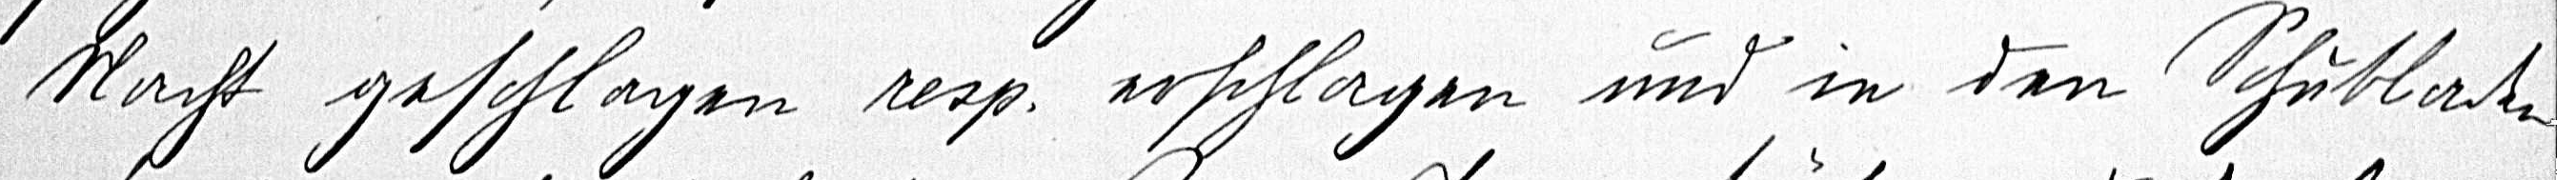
Nacht geschlagen resp. erschlagen und in den Schubladen
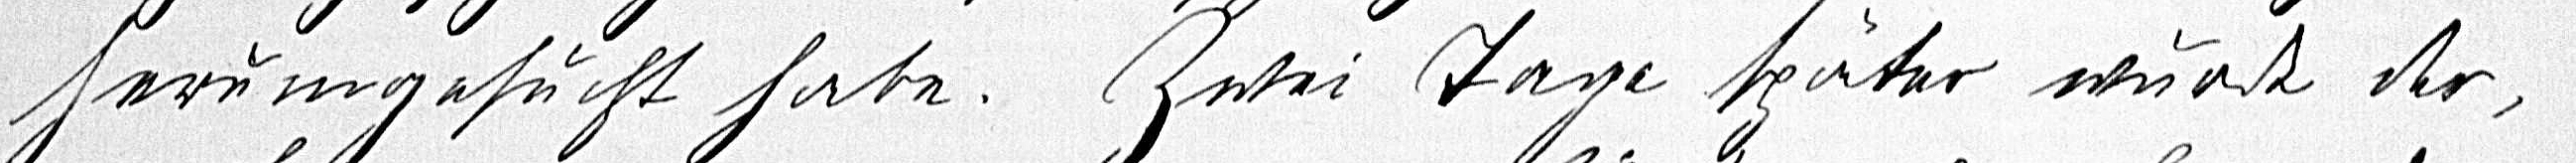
herumgesucht habe. Zwei Tage später wurde der,
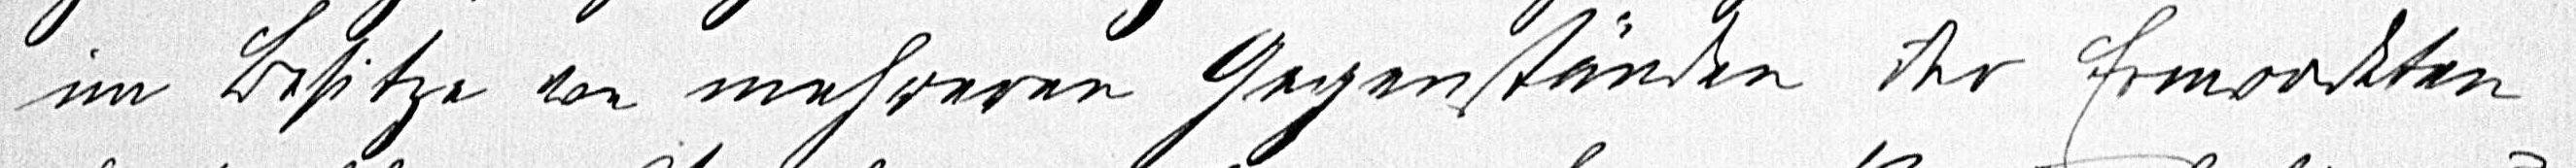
im Besitze von mehreren Gegenständen der Ermordeten
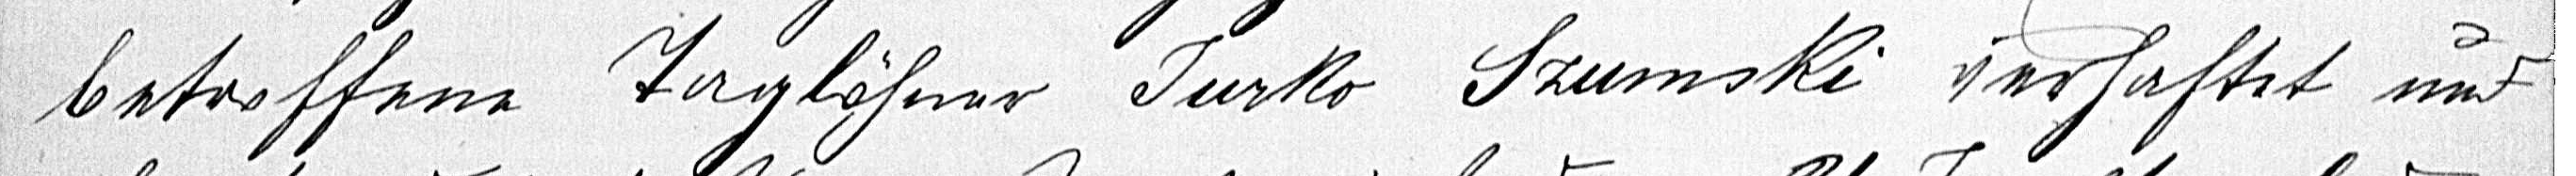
betroffene Taglöhner Jurko Szumski verhaftet und
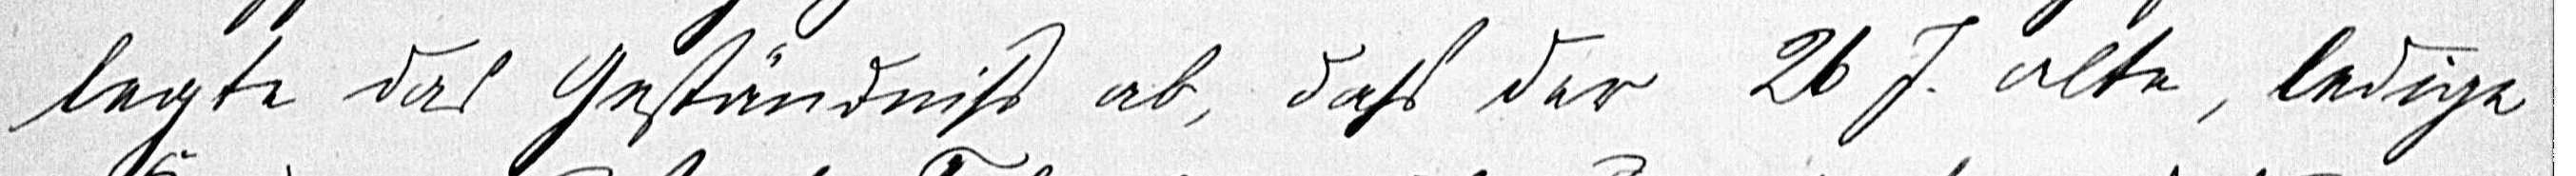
legte das Geständniß ab, daß der 26 J. alte, ledige
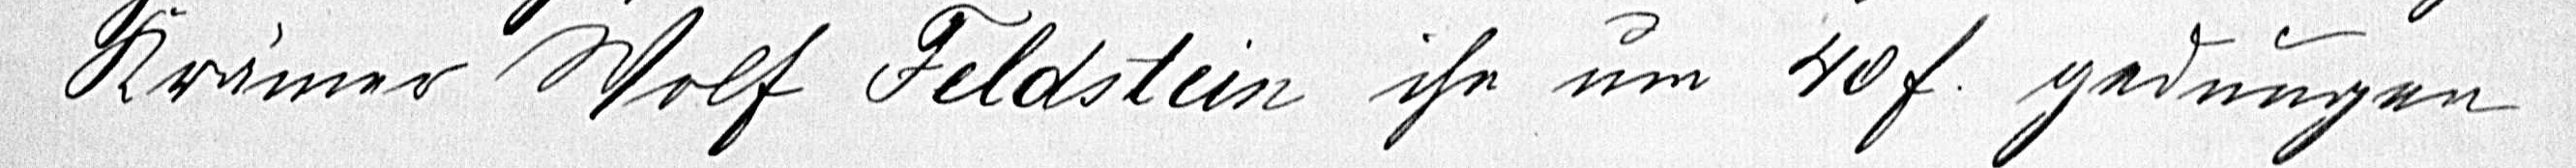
Krämre Wolf Feldstein ihn um 40 f. gedungen
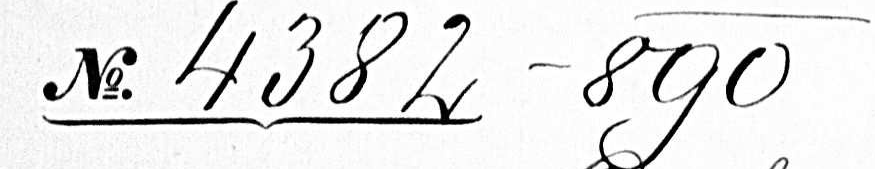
No. 4382 - 890
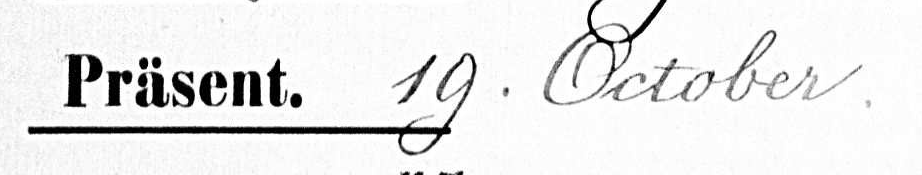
Präsent. 19. October.
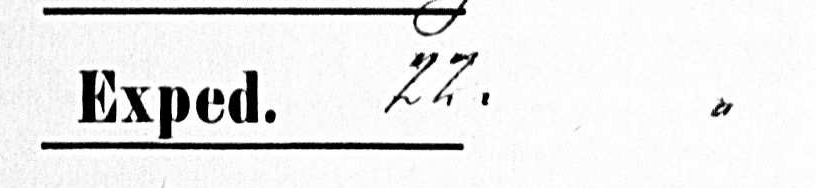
Exped. 22. October.
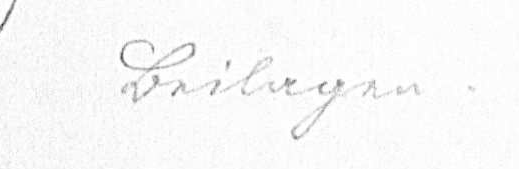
Beilagen.
